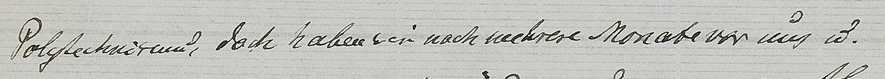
Polytechnikum, doch haben wir noch mehrere Monate vor uns u.
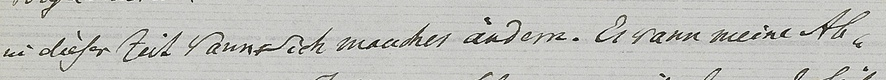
in dieser Zeit kann sich manches ändern. Es kann meine Ab-
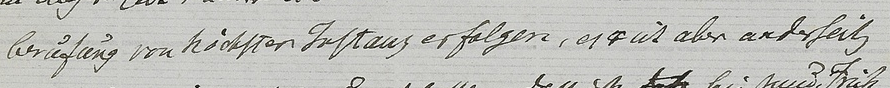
berufung von höchster Instanz erfolgen, es ist aber anderseits
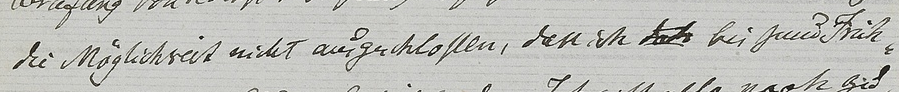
die Möglichkeit nicht ausgeschlossen, dass ich doch bis zum Früh-
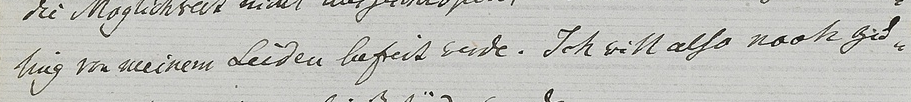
ling von meinem Leiden befreit werde. Ich will also noch zu-
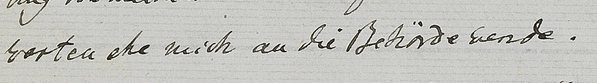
warten ehe mich an die Behörde wende.
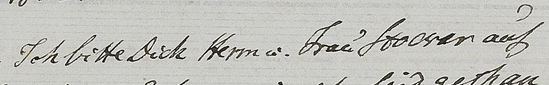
Ich bitte Dich Herrn u. Frau Stockar aufs
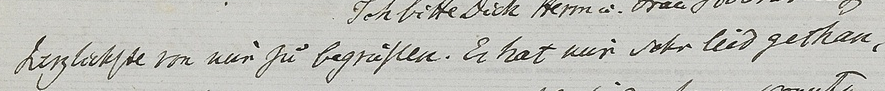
Herzlichste von mir zu begrüssen. Es hat mir sehr leid gethan,
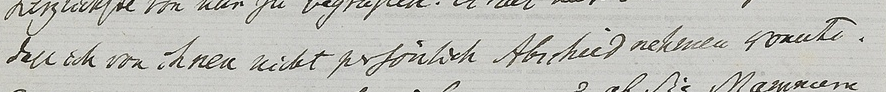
dass ich von ihnen nicht persönlich Abschied nehmen konnte.
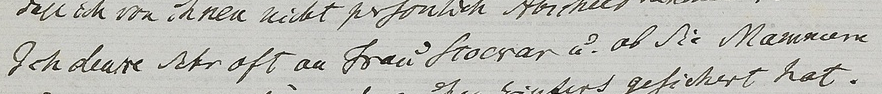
Ich denke sehr oft an Frau Stockar u. ob sie Mammern
